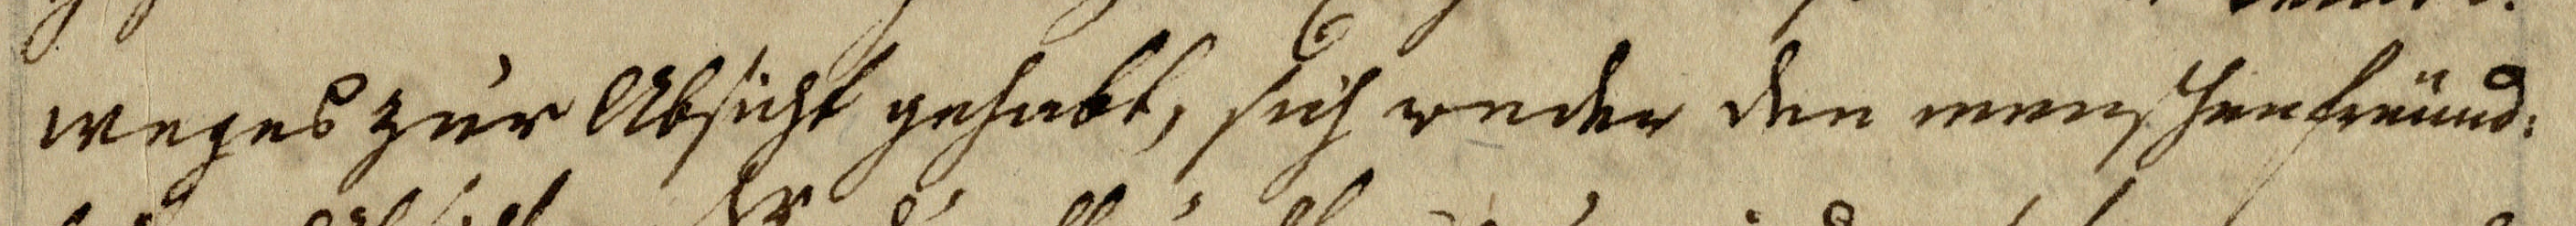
weges zur Absicht gehabt, sich weder den menschenfreund¬
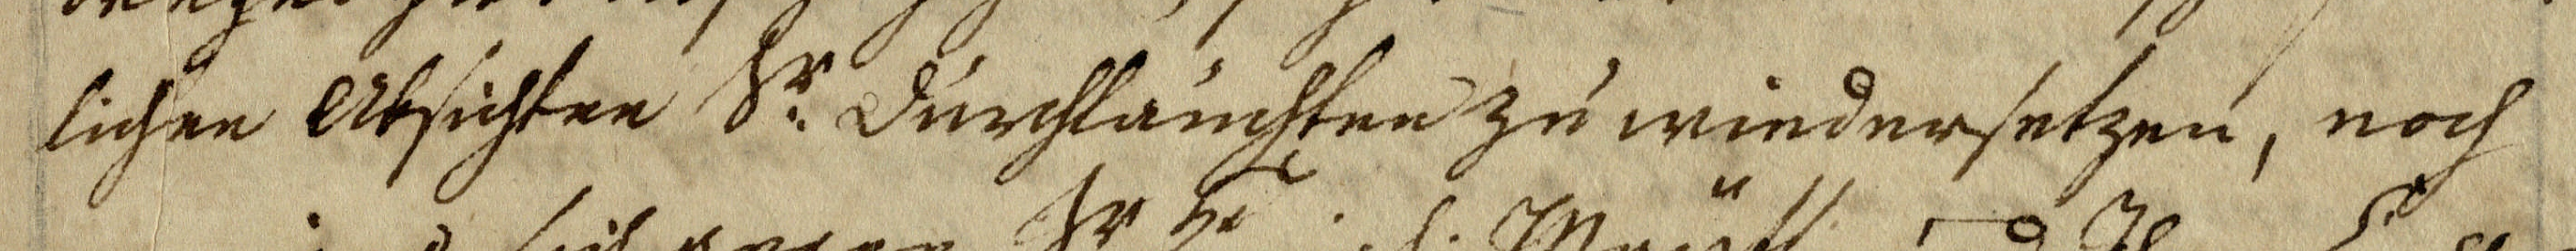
lichen Absichten Sr Durchlauchten zu wiedersetzen, noch
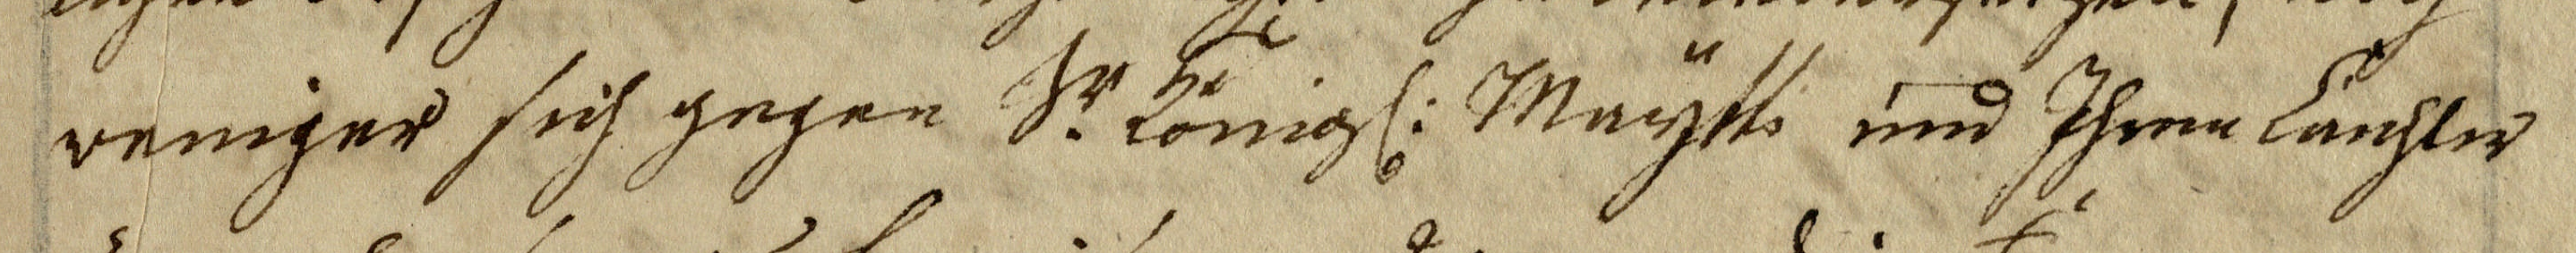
weniger sich gegen Sr Königl. Maÿtt. und Ihren Canzler
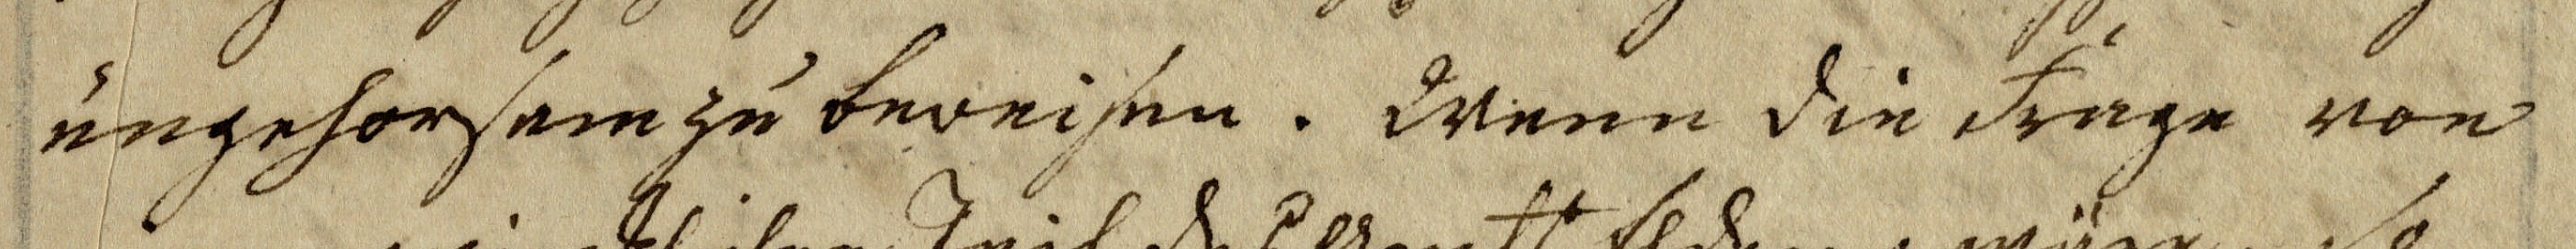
angehorsam zu beweisen. Wenn die Frage von
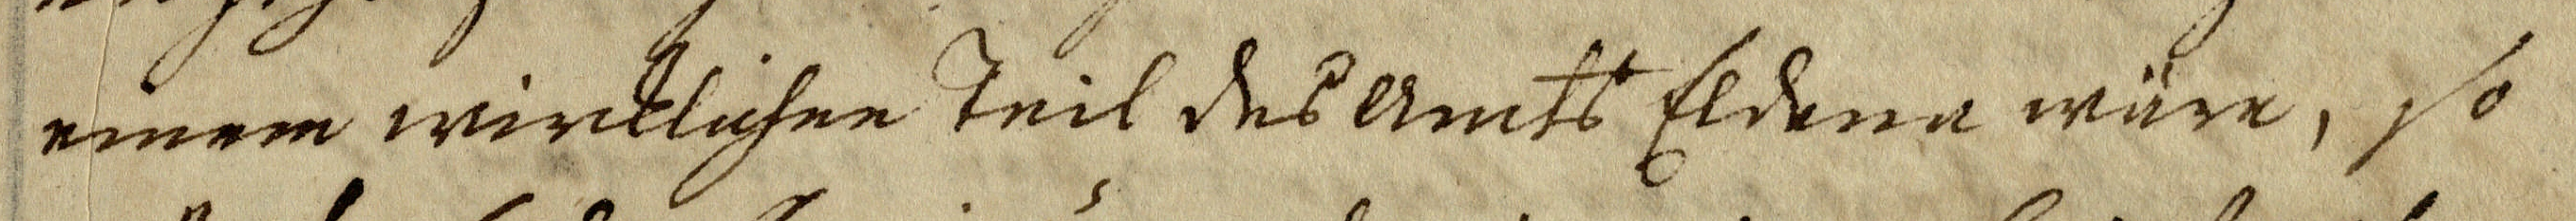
einem wirklichen Teil des Amts Eldena wäre, so
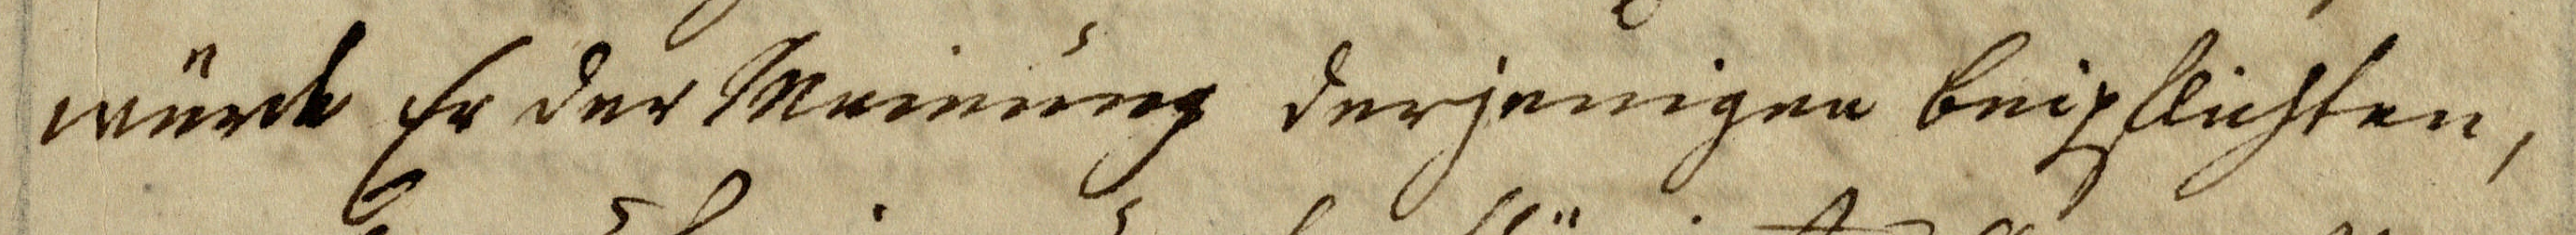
würde Er der Meinung derjenigen beipflichten,
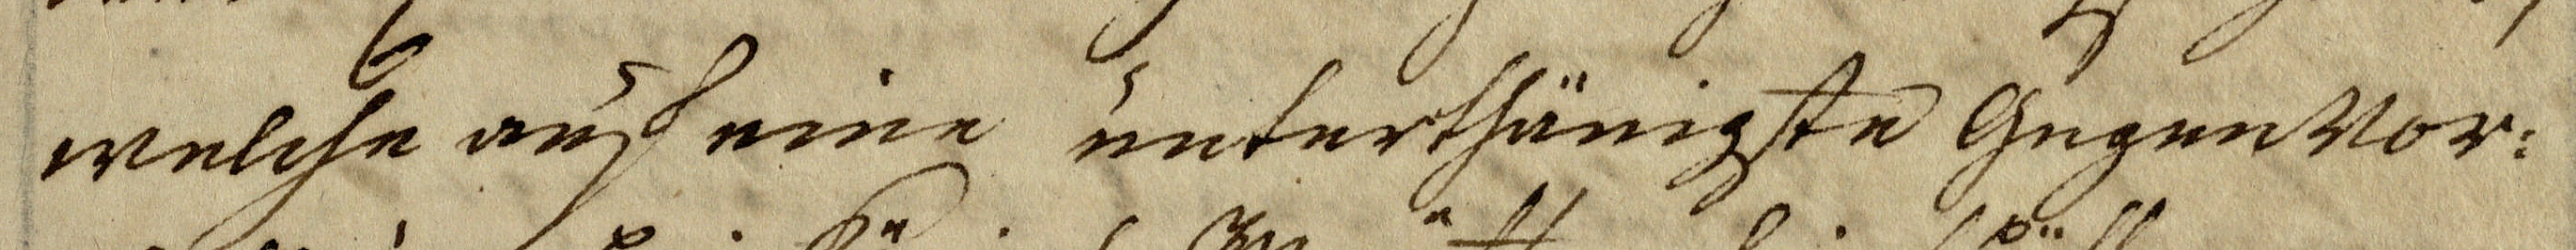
welche auf eine unterthänigste Gegenvor¬
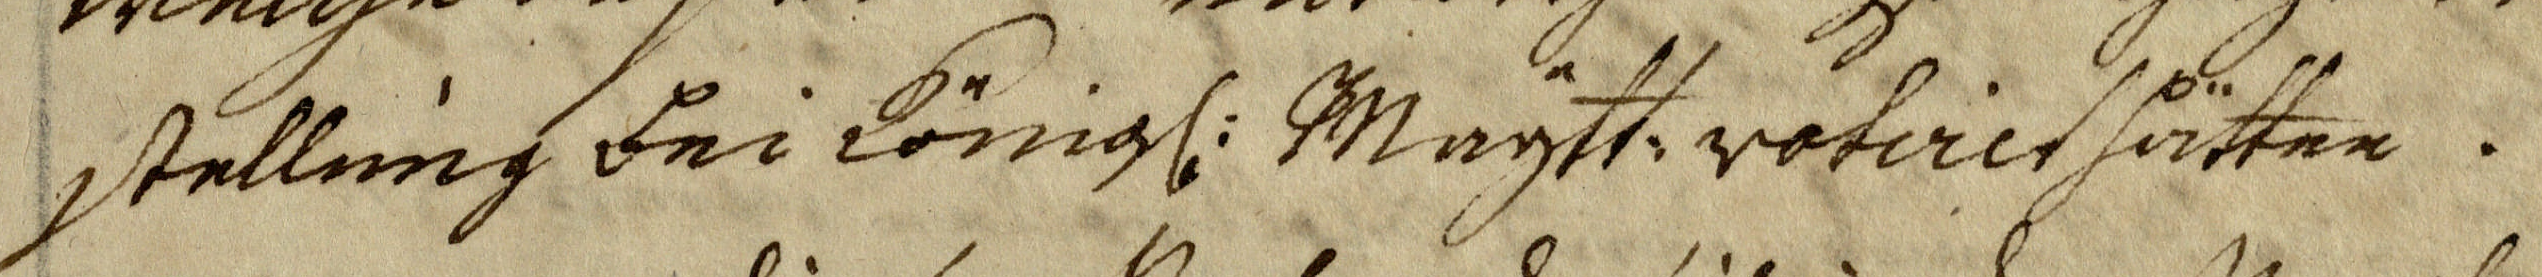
stellung bei Königl. Maÿtt. votiret hätten.
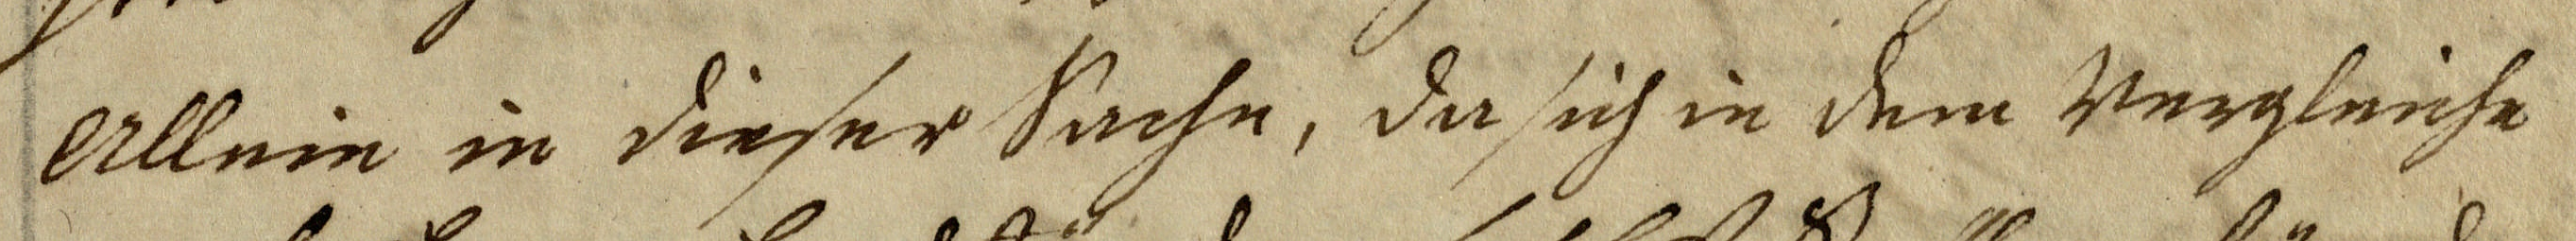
Allein in dieser Sache, da ich in dem Vergleiche
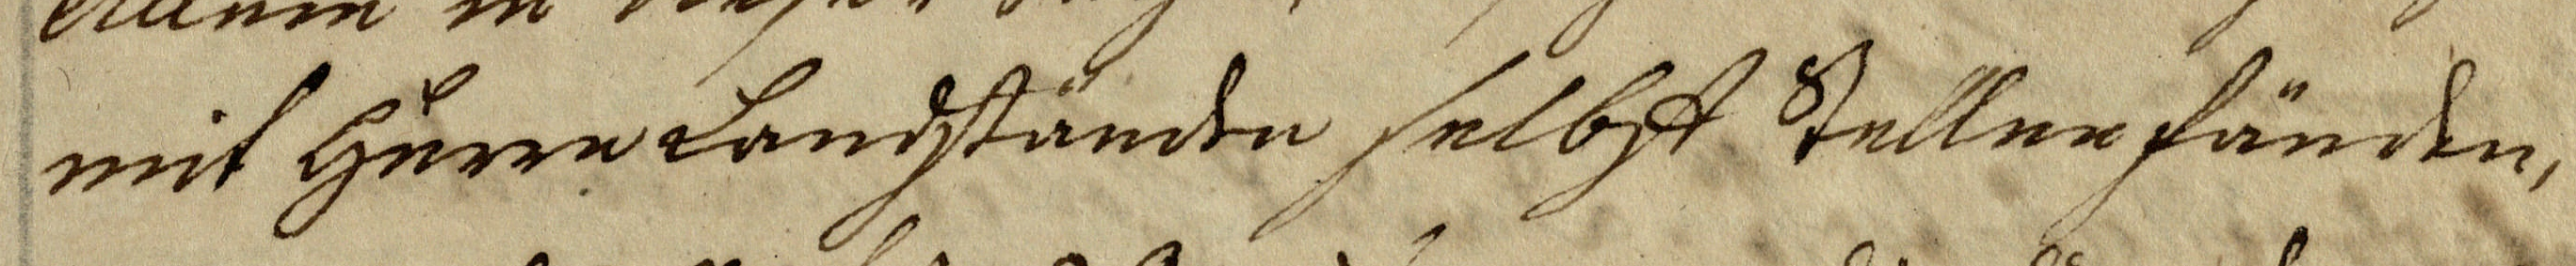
mit Herrn Landständen selbst Stellen fänden,
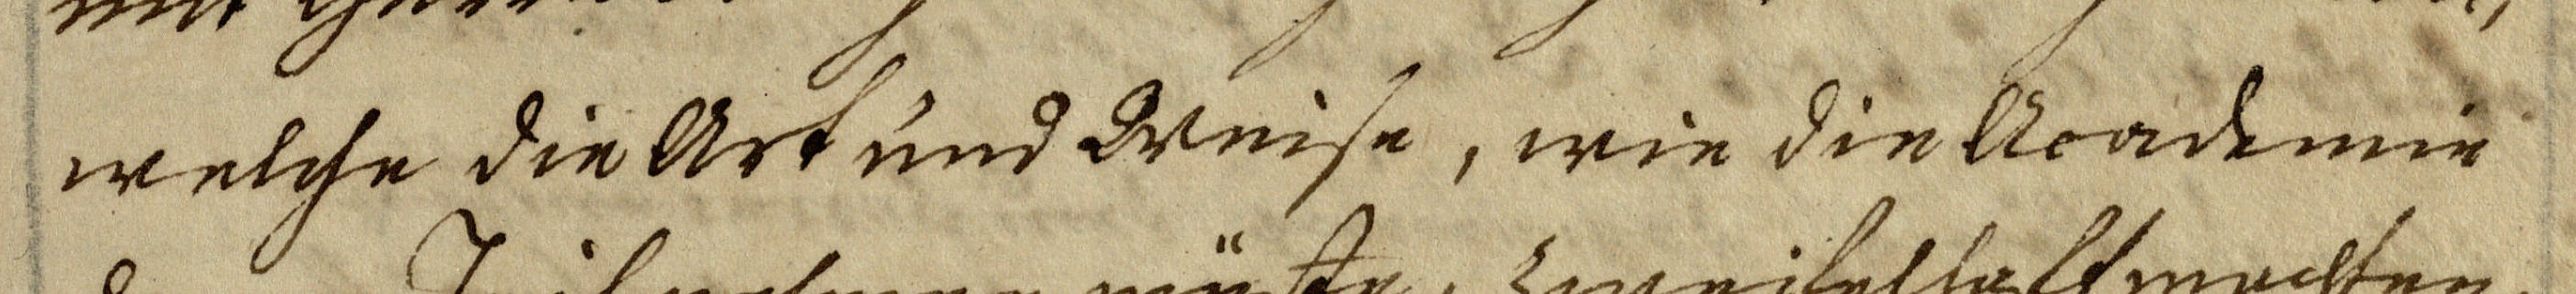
welche die Art und Weise, wie die Academie
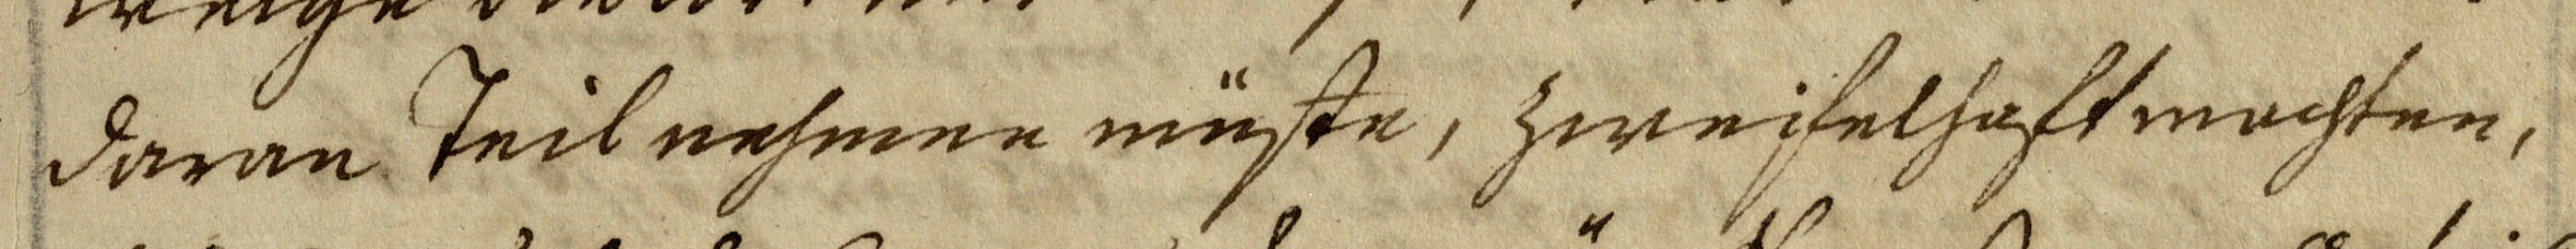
daran Teil nehmen müßte, zweitelhaft machten,
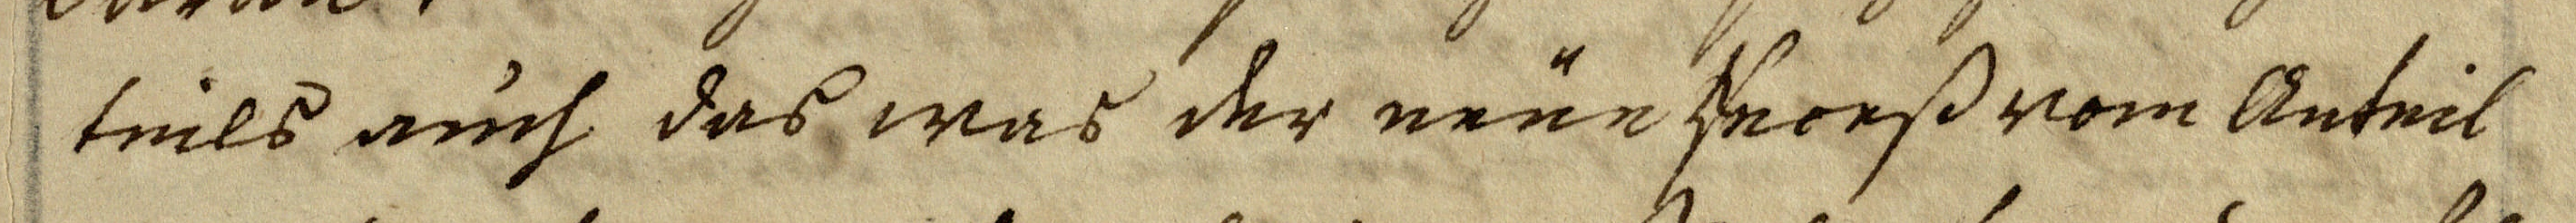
teils auch das was der neue Receß vom Anteil
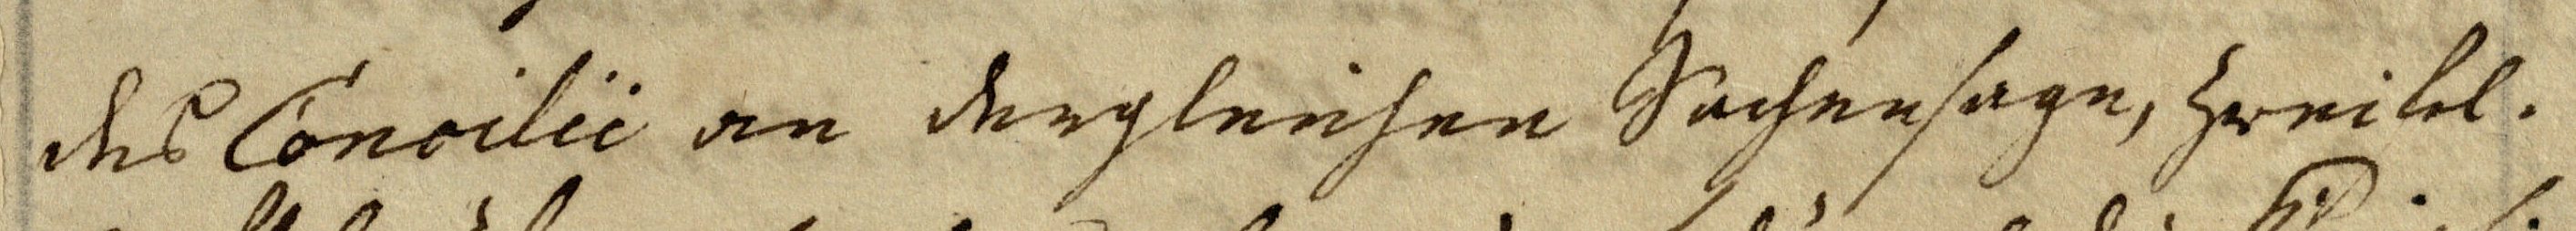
des Concilii an dergleichen Sachen sage, Zweifel¬
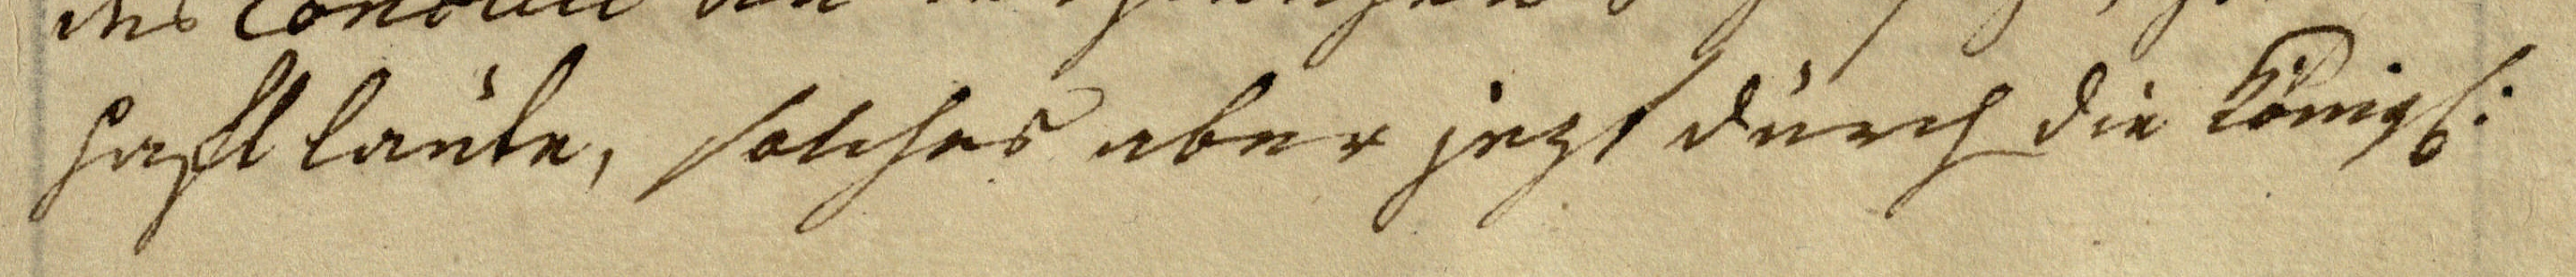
haft laute, solches aber jezt durch die Königl.
